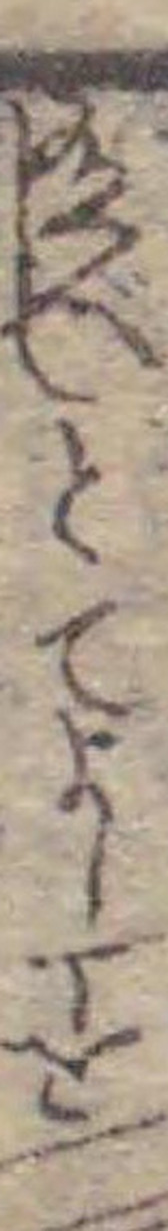有べしとてよし丁を
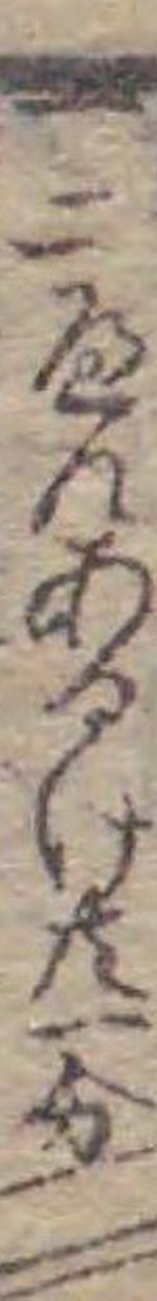一二へんあるけ共一分
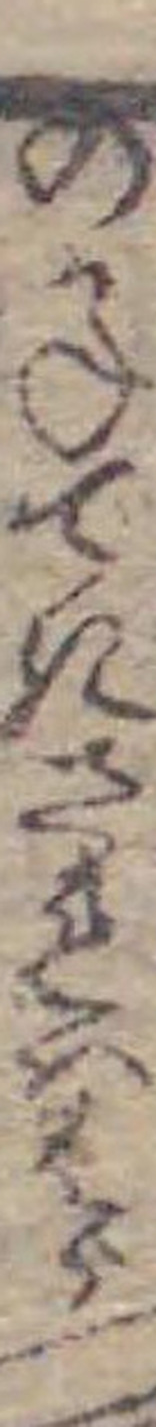のかねで化されははら
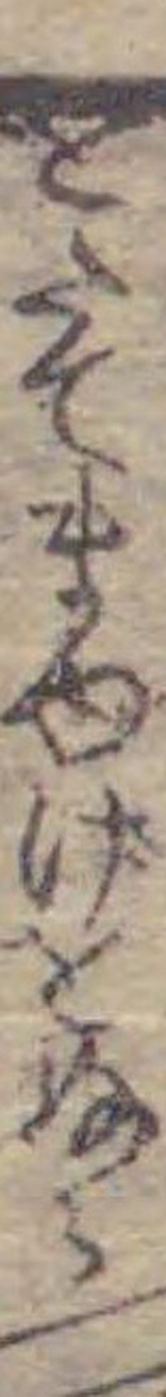をたてまゆげをぬら
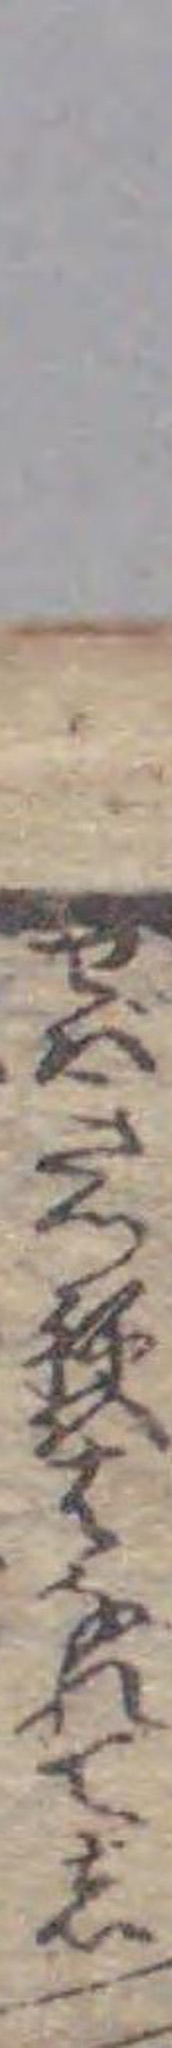せばきつねははなれてし
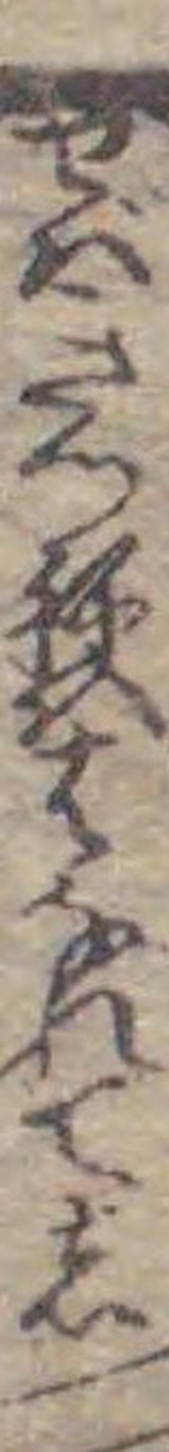せばきつねははなれてし
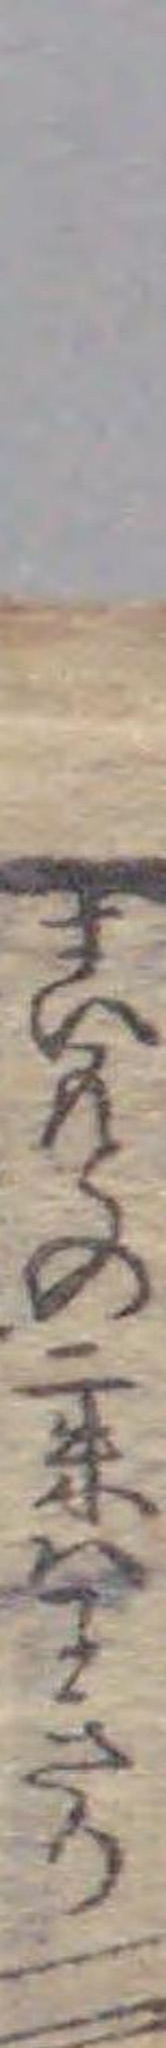まいもとの二朱はにきり
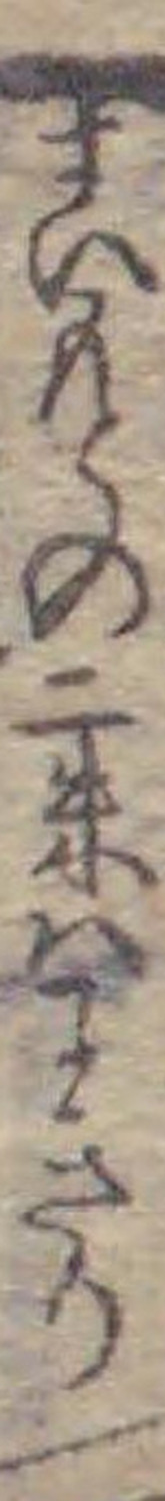まいもとの二朱はにきり
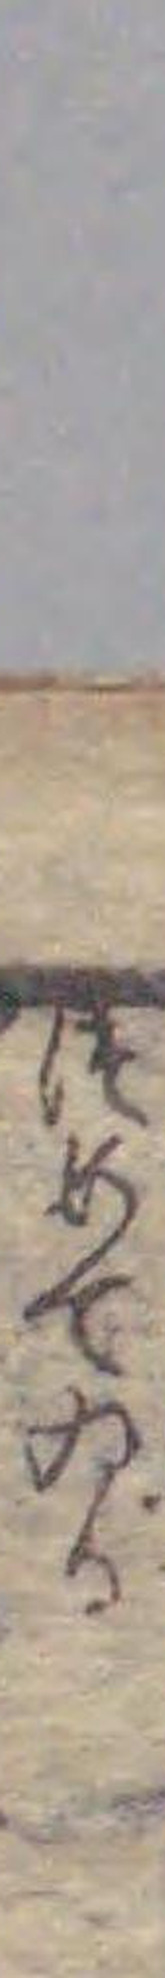つめてゐる
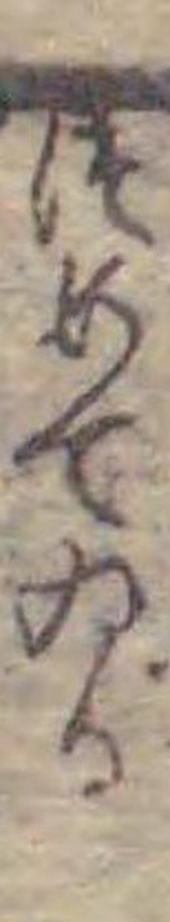つめてゐる
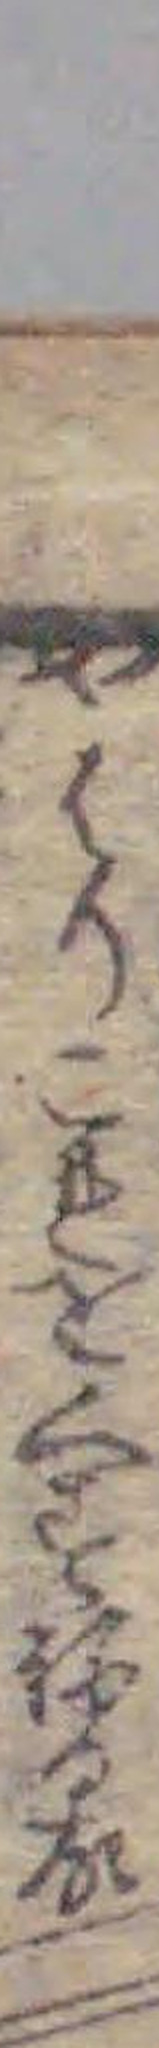やはりこれをくすねる故
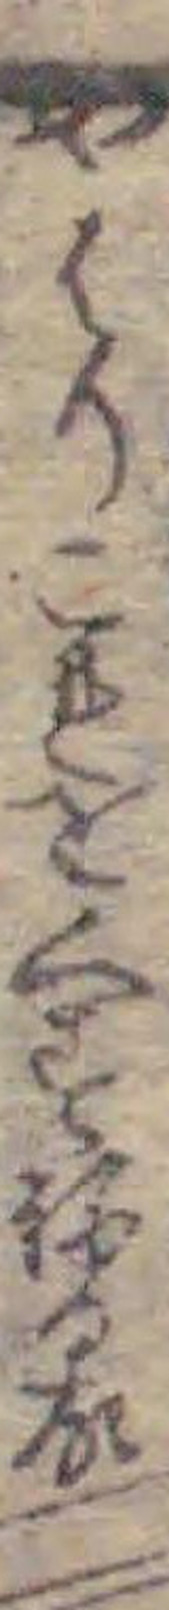やはりこれをくすねる故
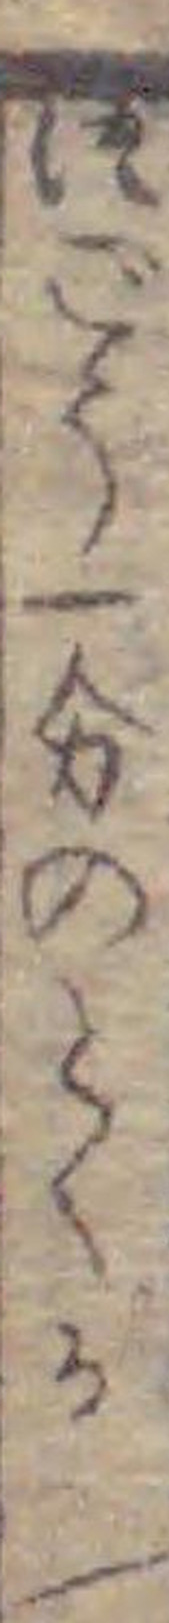つごう一分のとくか

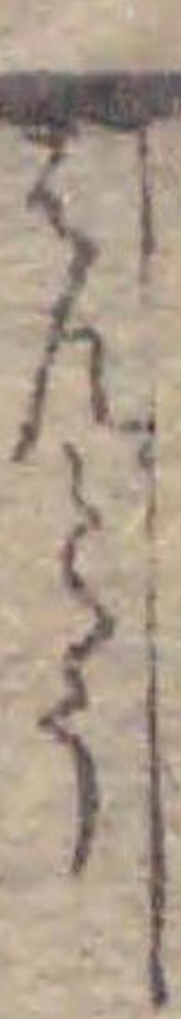はんとう
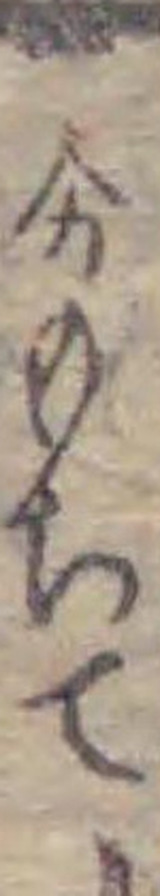一分もちて
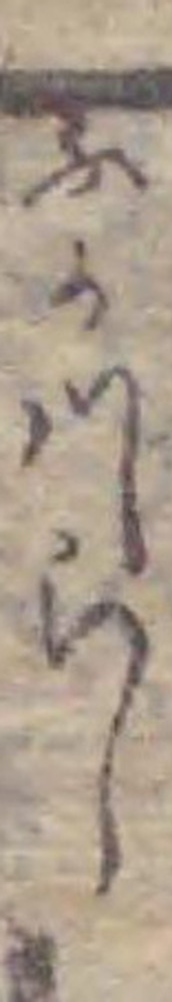ふか川らし
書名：紺屋百物語 : 3巻
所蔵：国立国会図書館 National Diet Library, JAPAN
